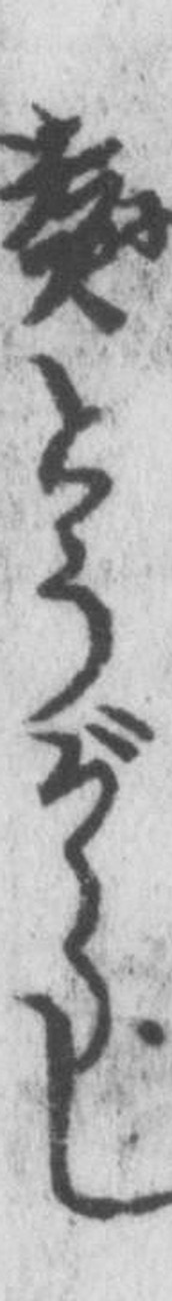煮とうがらし
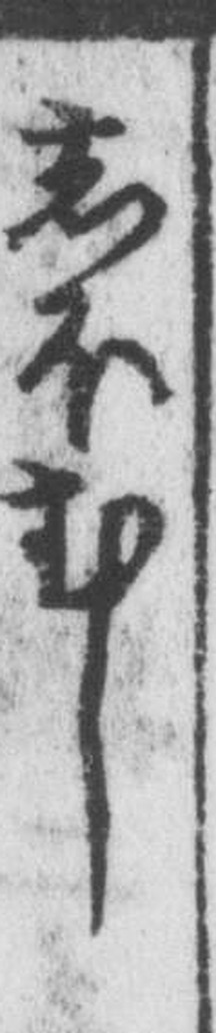しほむし
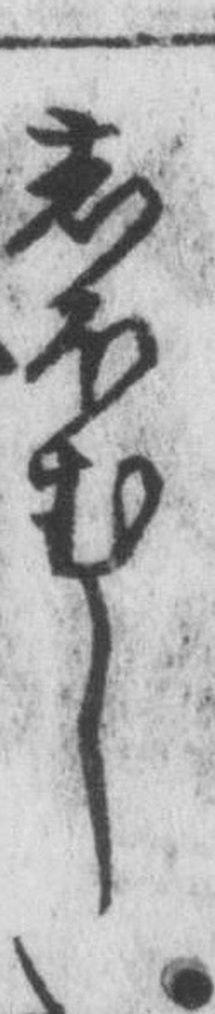しほむし
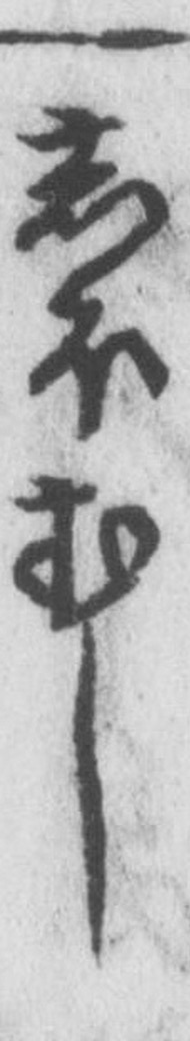しほむし
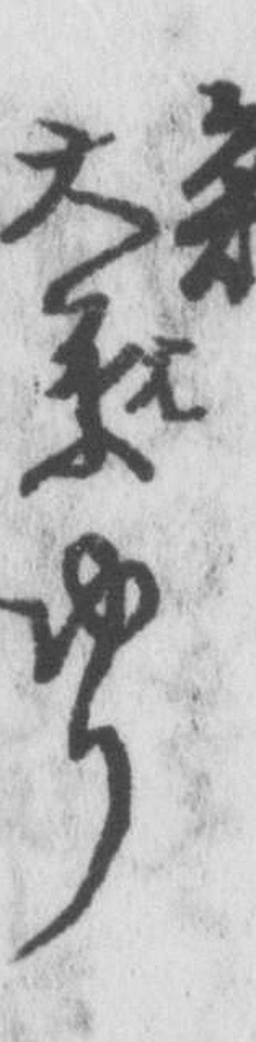大葉ゆり
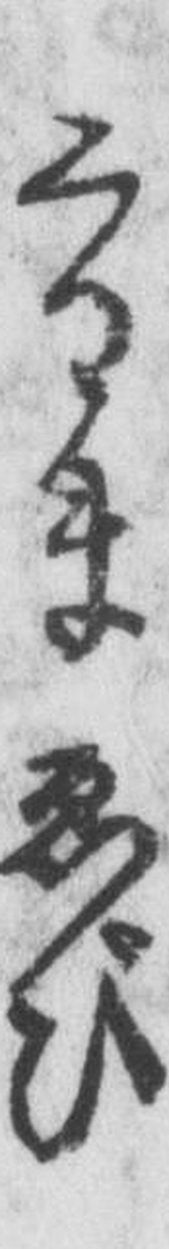くるまゑび
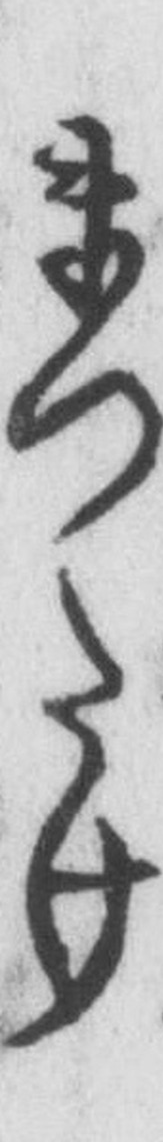はつたけ
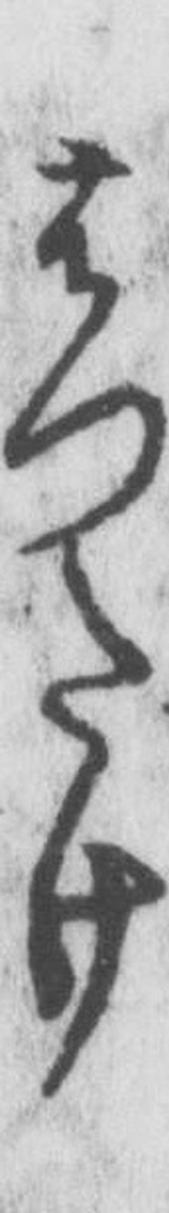はつたけ
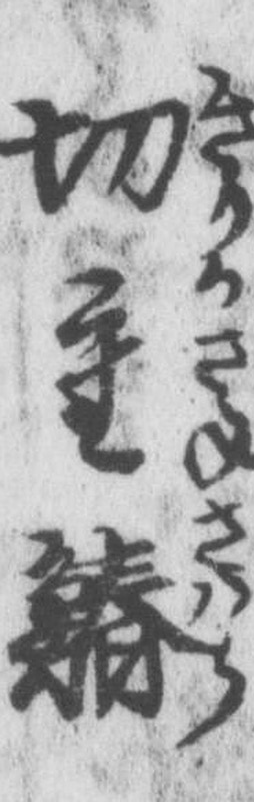切重鰆
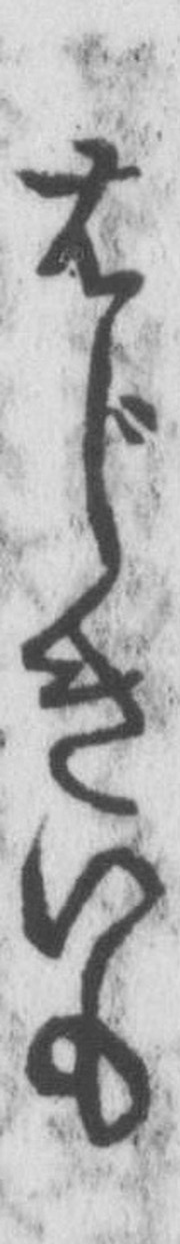はじきいも
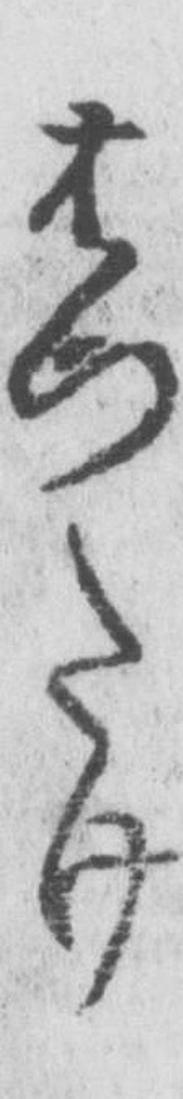はつたけ
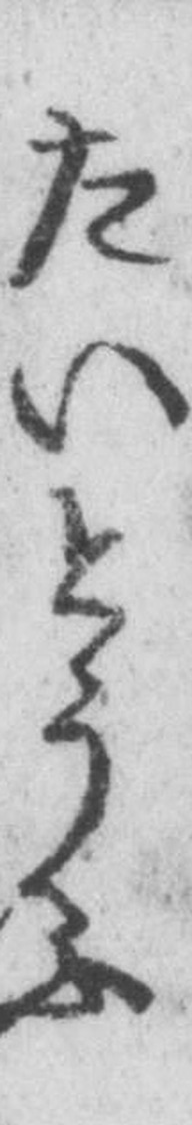うつとうふ

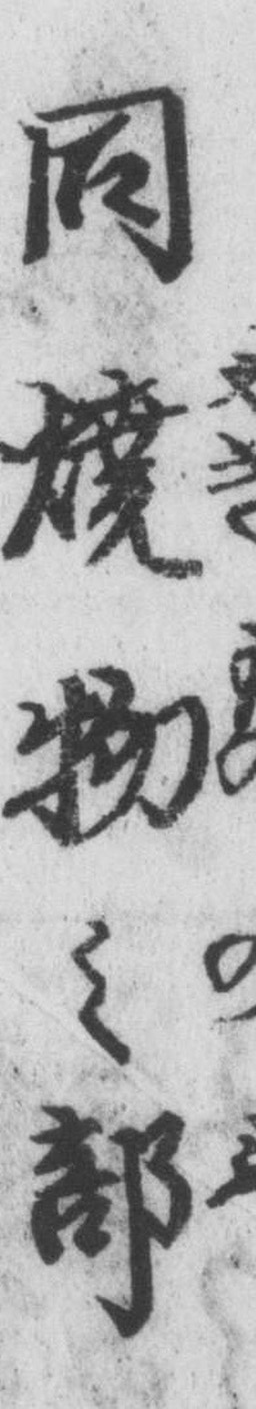同焼物之部
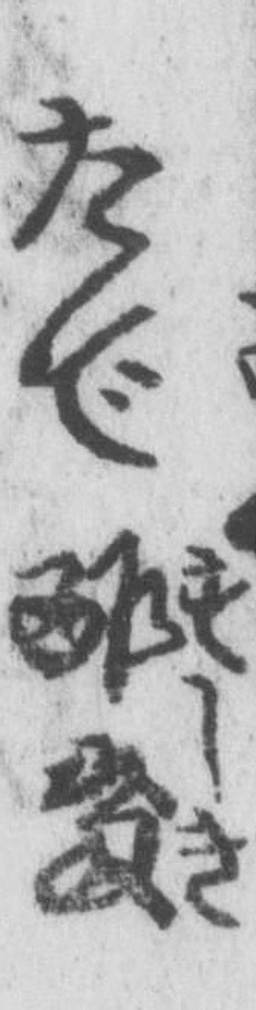たで酢敷
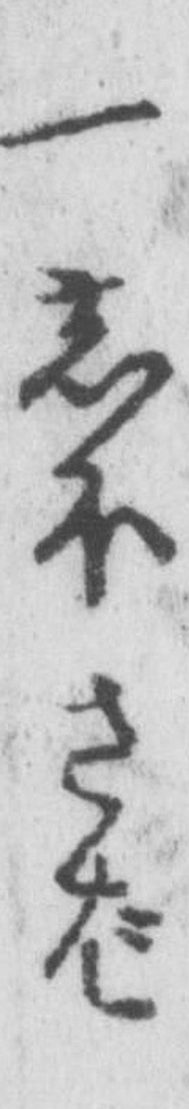一しほさば
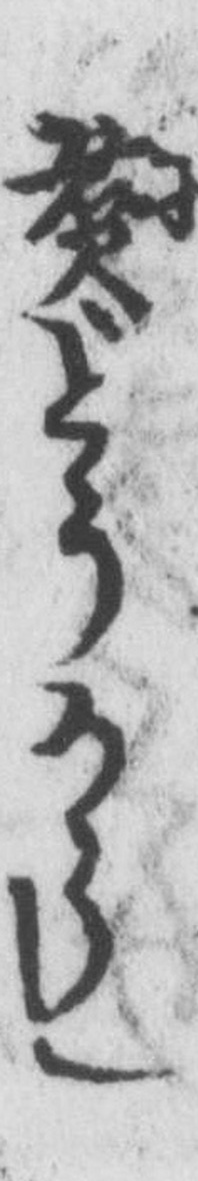煮どうからし
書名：当世料理献立
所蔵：大阪府立大学学術情報センター 国文学研究資料館
